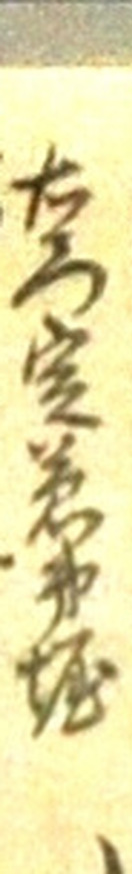右衛門定兼弟堀
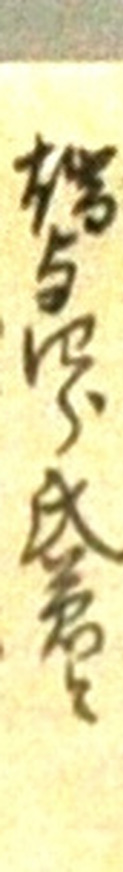場与四郎氏兼と
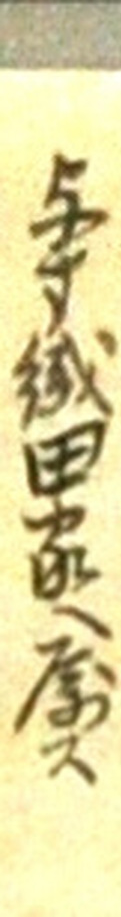与す織田家へ属ス
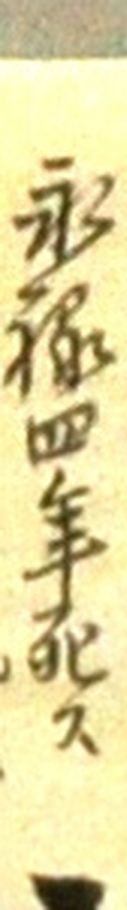永禄四年死ス
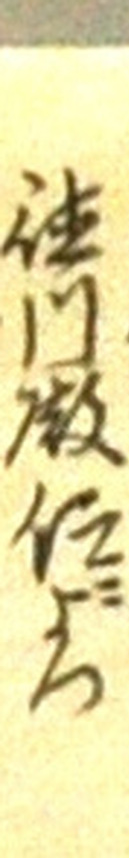徳川殿仰によつ
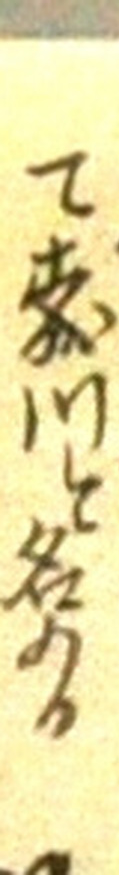て森川と名のる
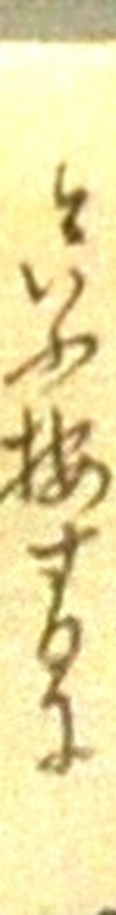といふ按するに
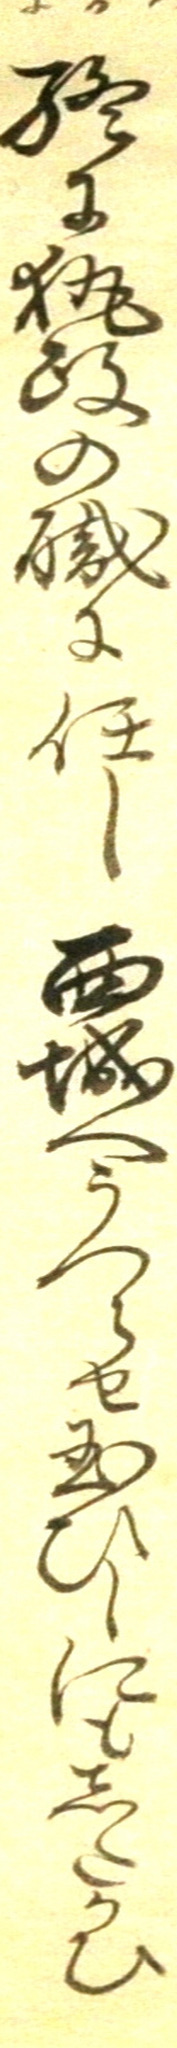終に執政の職に任し西城へうつらせ玉ひしにもしたかひ
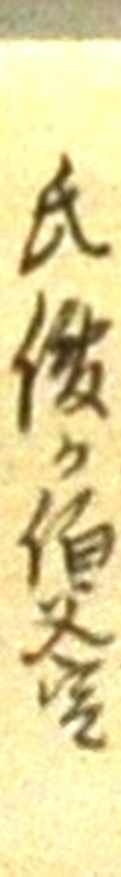氏俊か伯父定
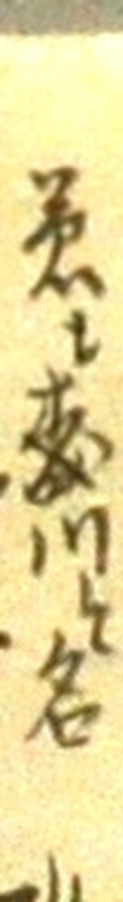兼も森川と名
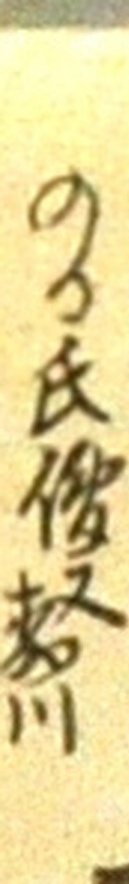のる氏俊又森川
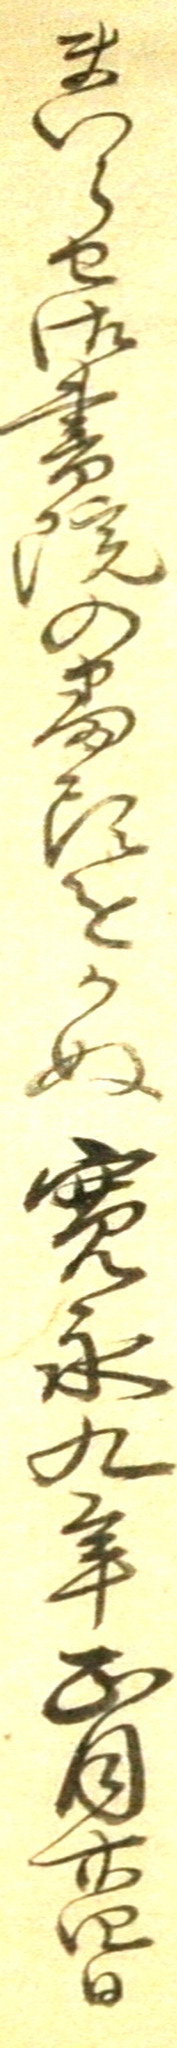まいらせ御書院の番頭をかぬ寛永九年正月廿四日
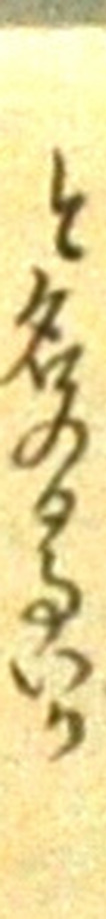と名のる事いか
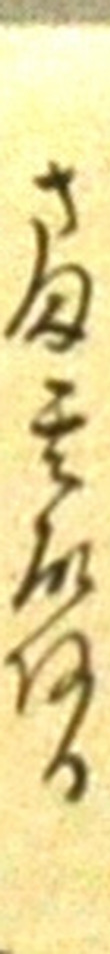さま其故ある
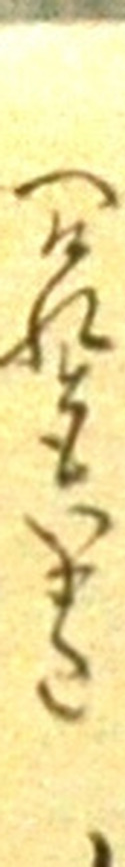へけれともいまた
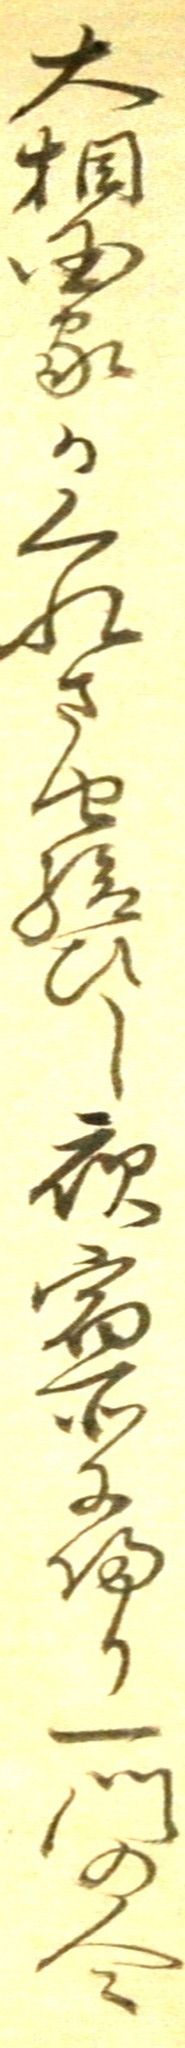大相国家かくれさせ給ひし夜宿所にかえ帰り一門の人々
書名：藩翰譜（五）
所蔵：伊那市立高遠町図書館・合同会社AMANE
